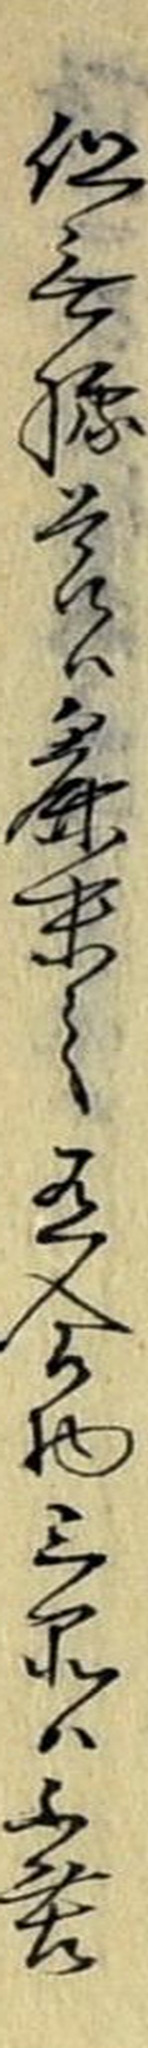但無拠節は麁末之有合物三品は不苦
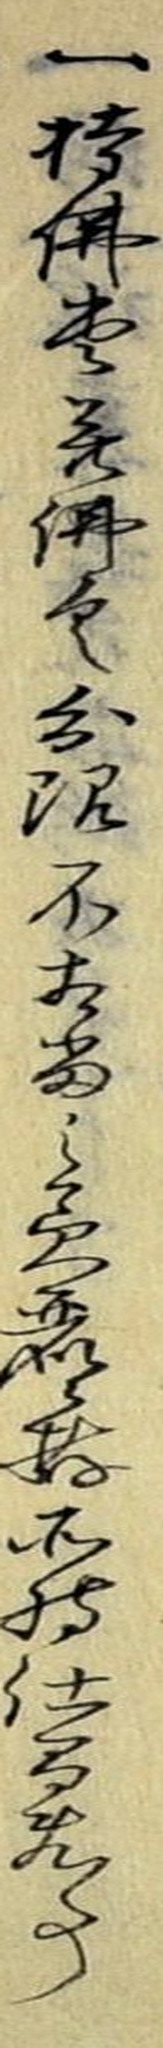一持仏堂井仏具分限不相当之美麗に拵所持仕間敷事
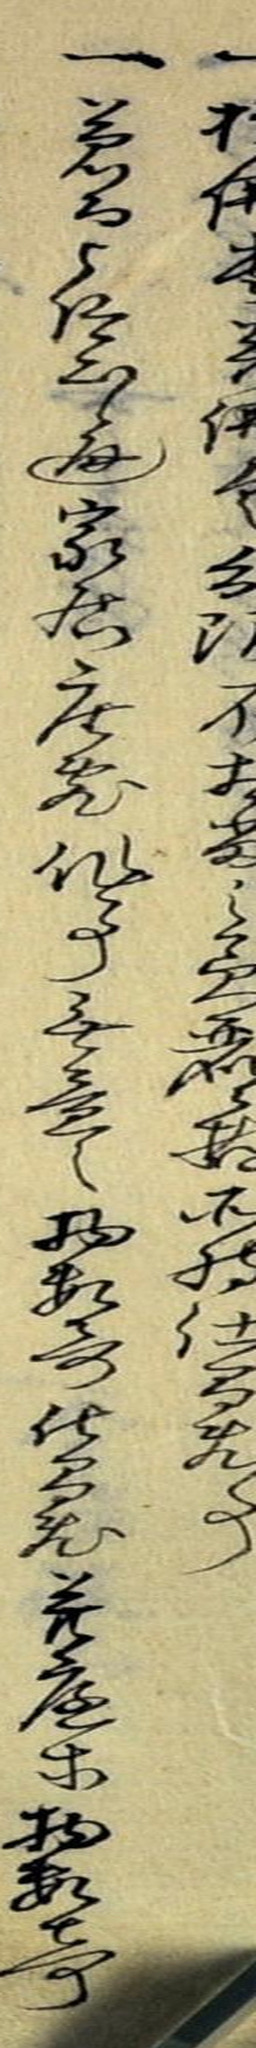一兼而被仰出候通家居座敷作事無益之物数気仕間敷井庭等物数気
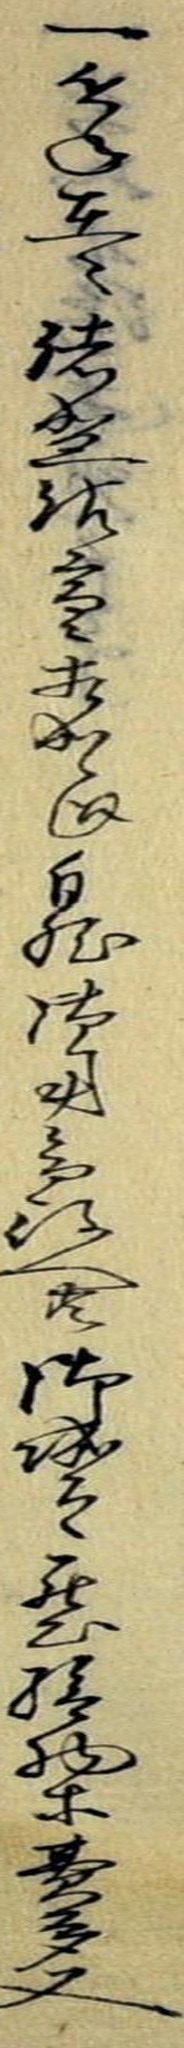一近年在々諸盛銀高に相成候趣自然御用に而役人共御城下へ罷出給物等費多又
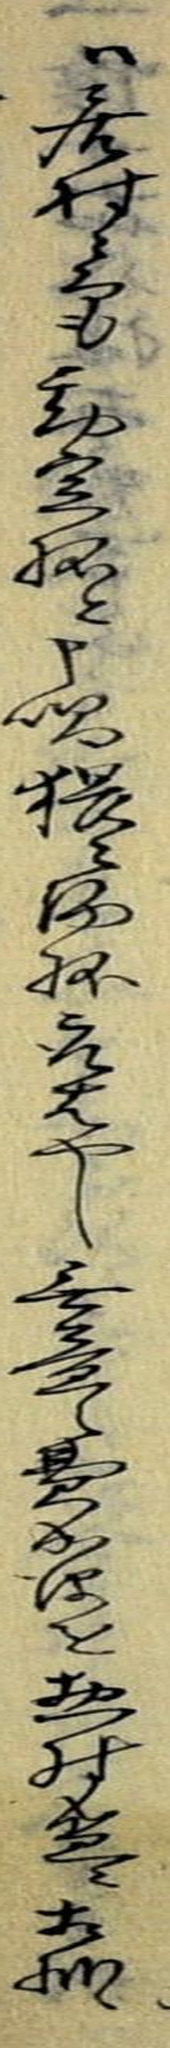居村に而も勘定抔と申唱猥に酒抔取はやし無益之費成儀を惣村盛に相掛候
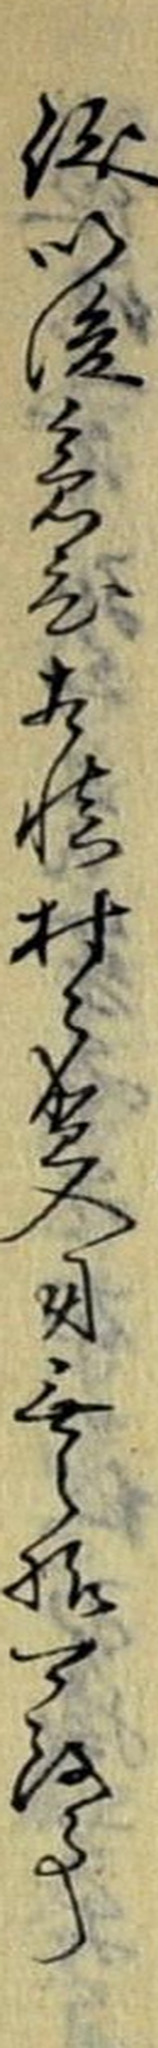儀以後急度相慎村々盛入用無之様可致事
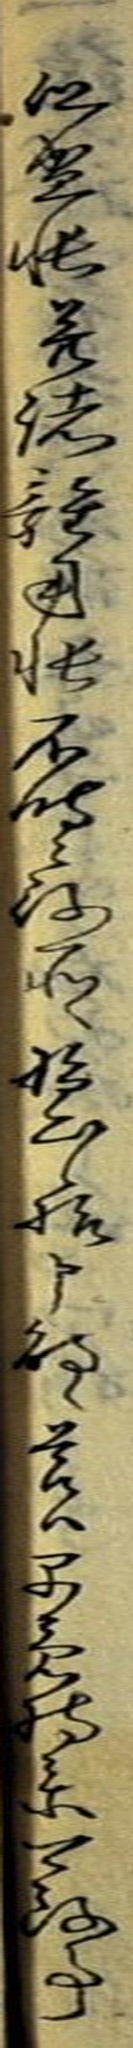但盛帳井諸雑用帳不時に役所へ指出候様申触候節は早急持参可致事
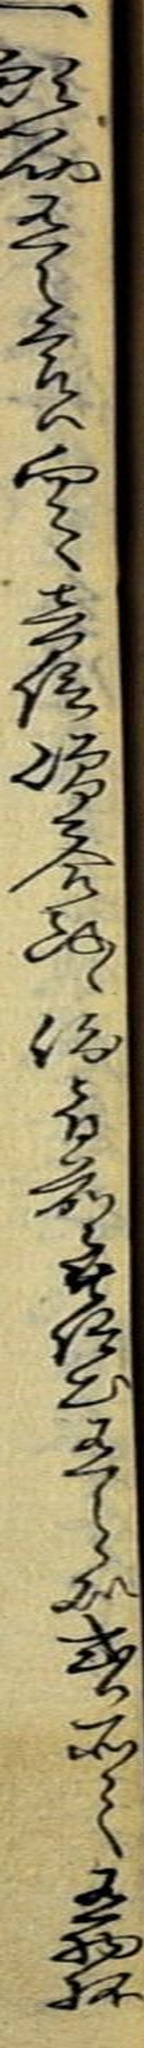一願筋有之節は向々へ音信贈答致候儀に付前々被仰出有之候処或は所々之有物抔
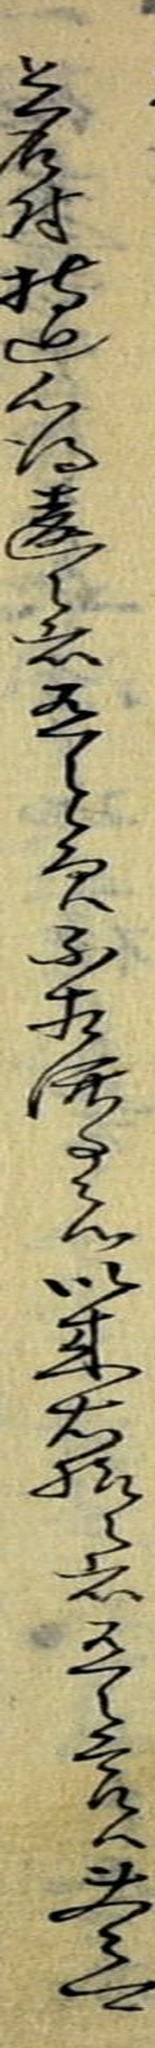と名付持廻心得違之者有之候而は不相済事に候以來右様之者有之節は夫々可
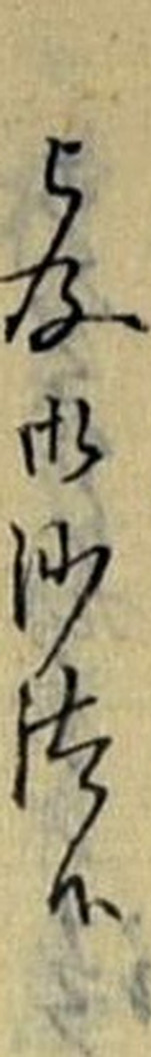被及御沙汰候
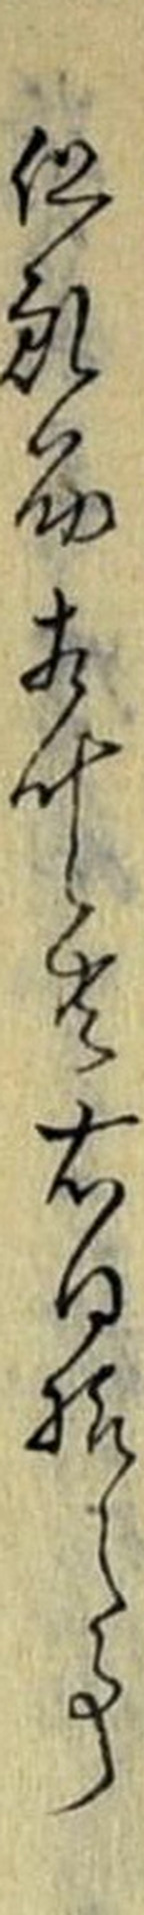但願筋相叶候共右同様之事
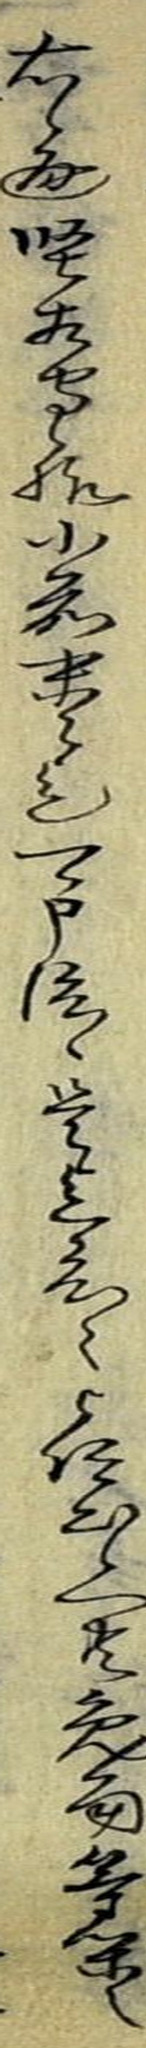右之通堅相守候様小前末々迄可申渡候是迄度々被仰出候へ共兎角等閑之
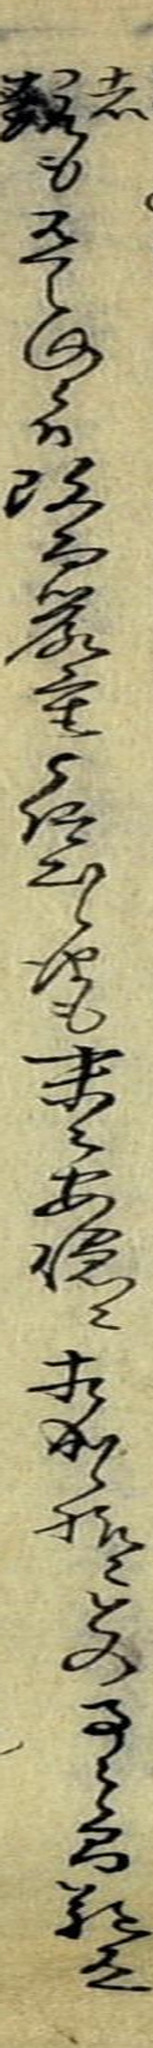趣も有之趣に付改而厳重被仰出候儀も末々安穏に相成候様にとの事に候間難有
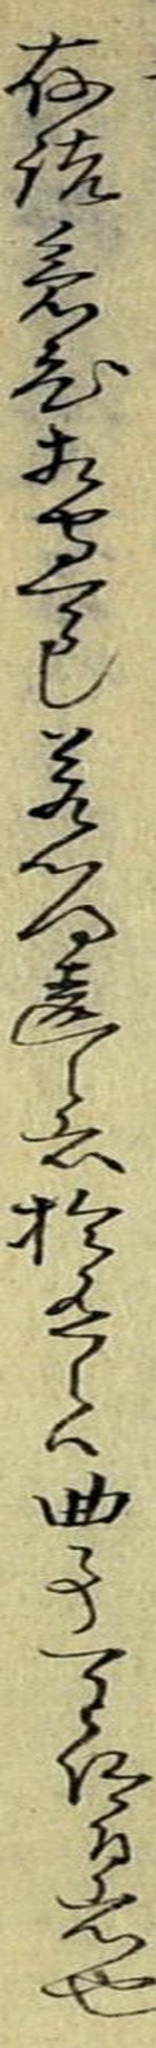存詰急度相守可申候若心得違之者於有之ハ曲事可被仰付者也
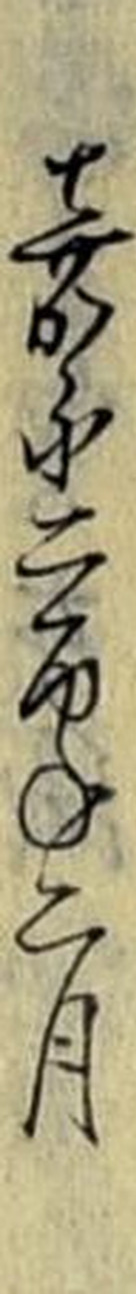嘉永二酉年二月
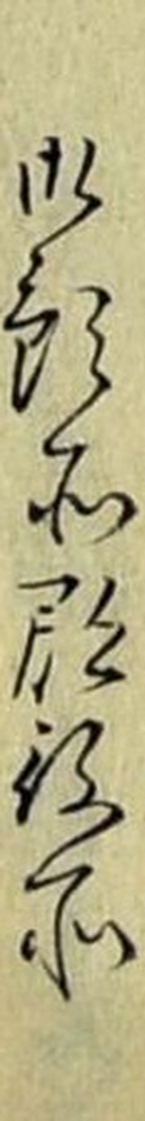御預所郡役所
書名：命令之部 六
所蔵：福井県文書館 Fukui Prefectural Archives
